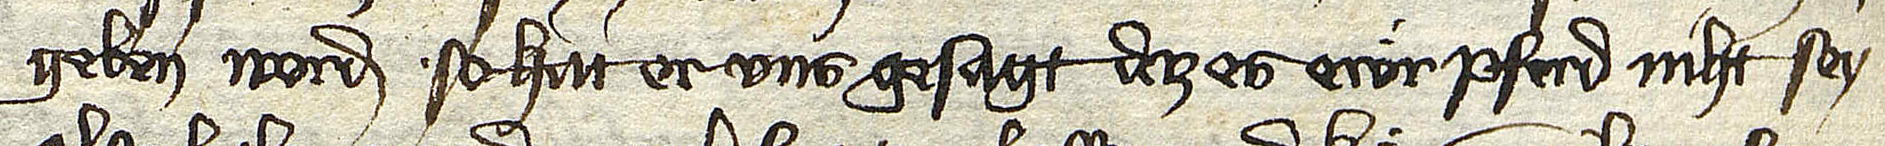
geben word* . ſo hat er vns geſagt daʒ es ewr pferd niht ſey
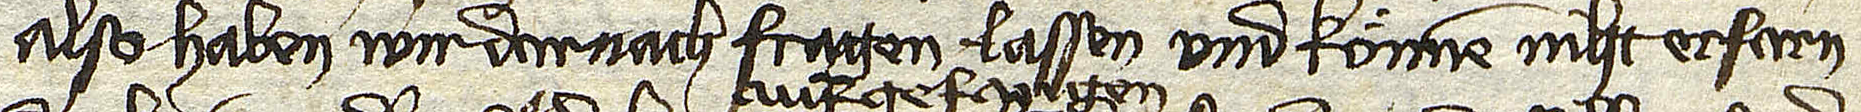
Alſo haben wir darnach fragen laſſen vnd könne* niht erfarn
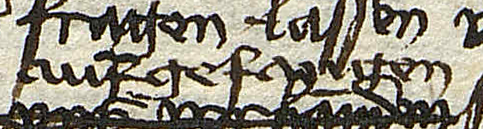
aufgefangen
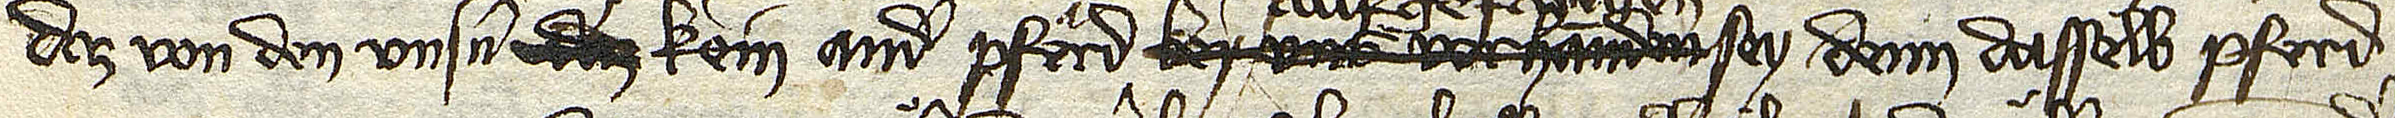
daʒ von den vnſ*n daʒ kein and* pfërd bey vns vorhanden ſey / denn daſſelb pferd
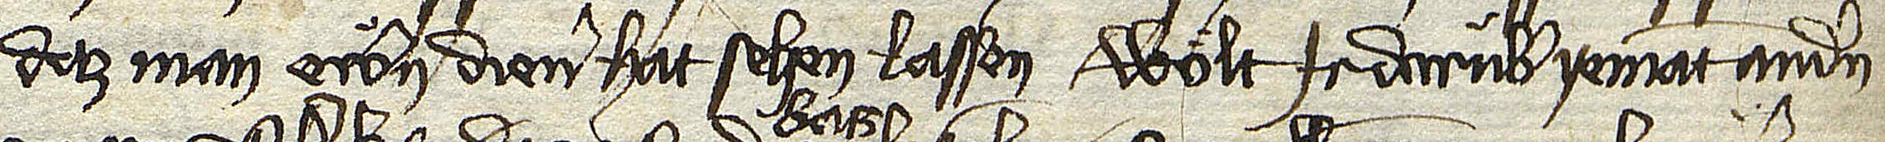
daʒ man ew*n dien* hat ſehen laſſen / Wölt Ir darüb* yema*t and*n
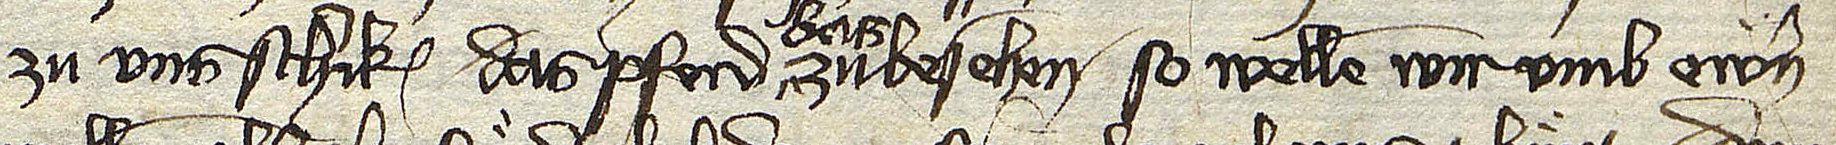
ʒu vns ſchik* / das pferd ʒubeſehen / ſo welle* wir vmb ew*n
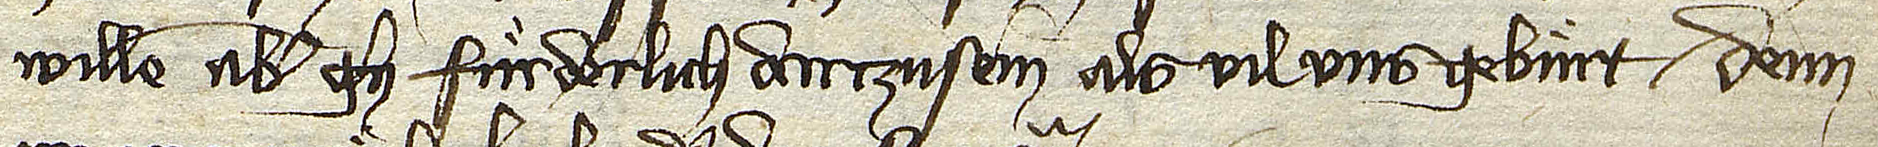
wille* ab* g*n fürderlich darcʒuſein als vil vns gebürt / Denn
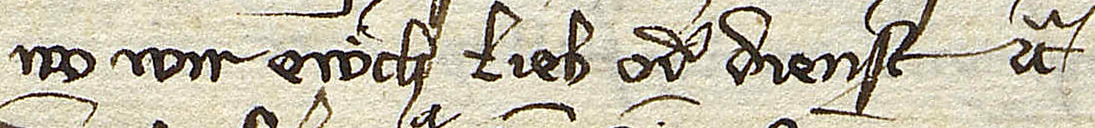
wo wir ewch lieb od* dienſt ec*
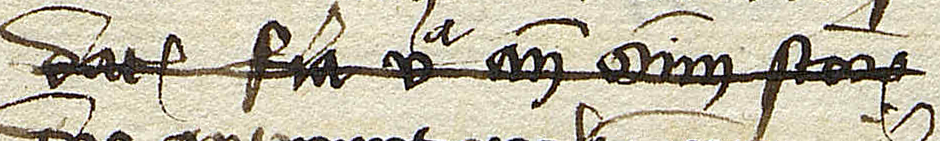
Dat* fia* v* an* Omi* ſco*
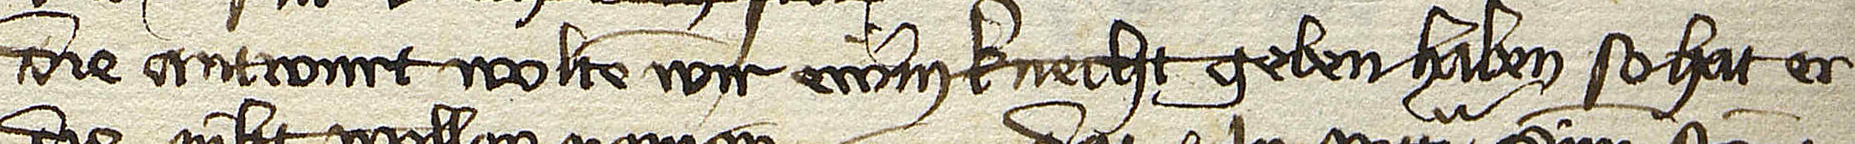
Die antwurt wolte* wir ew*m knecht geben haben ſo hat er
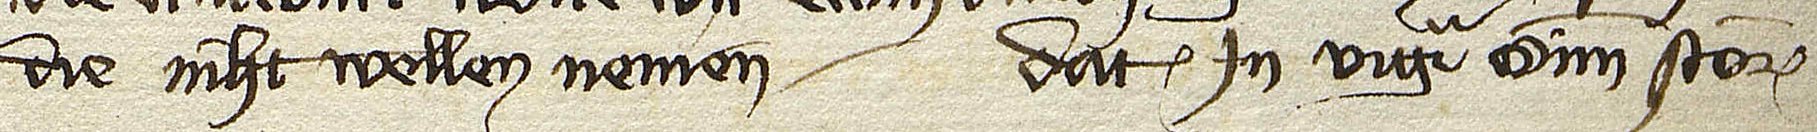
die niht wellen nemen / Dat* In vigi* Omi* ſco*
